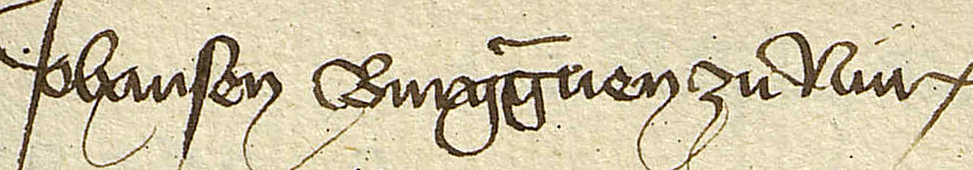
Iohanſen Burgg*uen cʒu Nür*
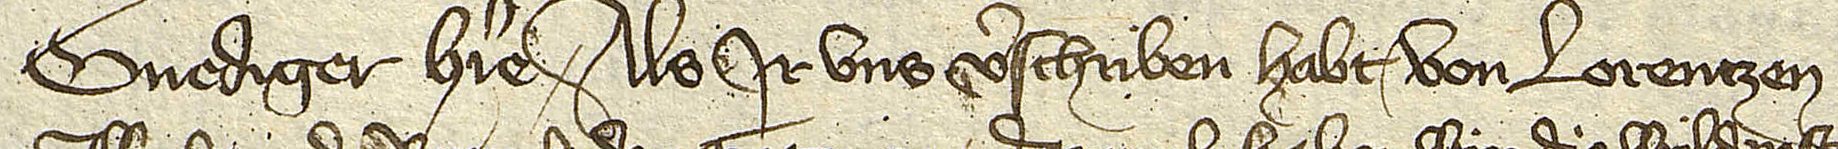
Gnediger h*re / Als Ir vns v*ſchriben habt / von Lorencʒen
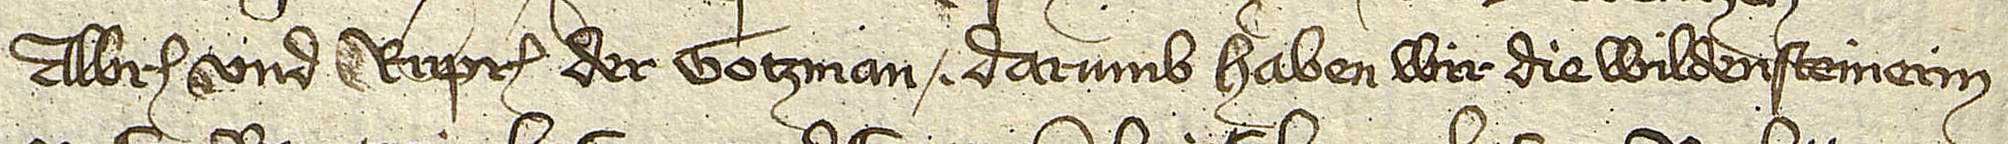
Albr* vnd Rupr* der Gocʒman / . darumb haben wir die wildenſteinerin
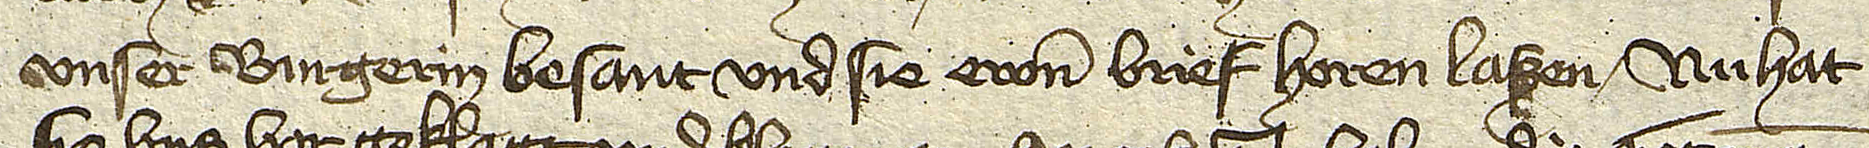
vnſer Burgerin beſant vnd ſie ewn* brief horen laſʒen / Nu hat
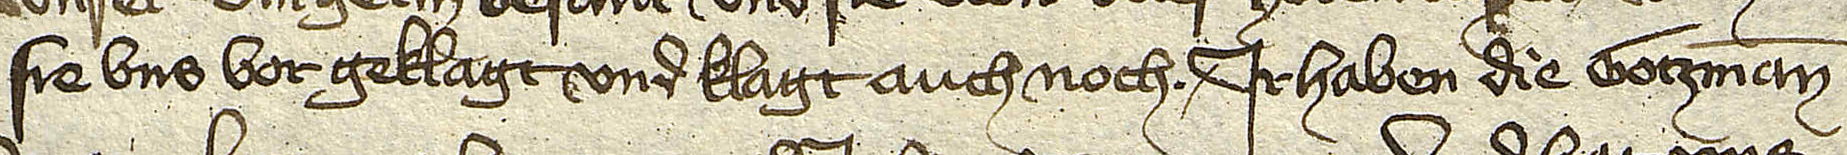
ſie vns vor geklagt vnd klagt auch noch . / Ir haben die Gocʒman*
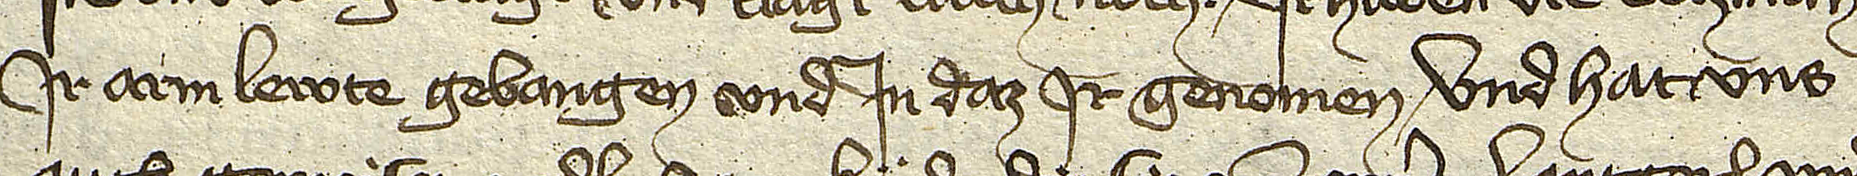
Ir arm lewte gevangen vnd In daʒ Ir genomen / vnd hat vns
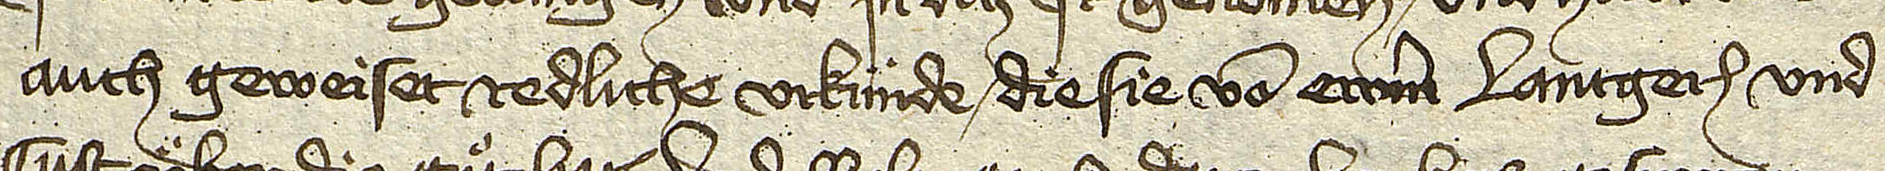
auch geweiſet redliche vrkünde / die ſie vo* ew*m Lantger* vnd
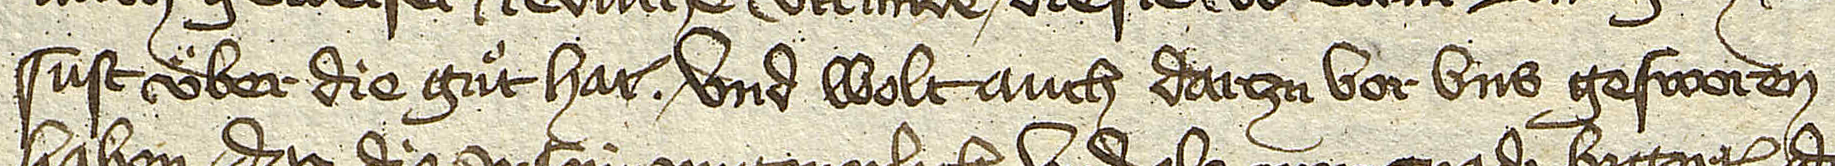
ſuſt v̈ber die güt hat . / vnd wolt auch darcʒu vor vns geſworen
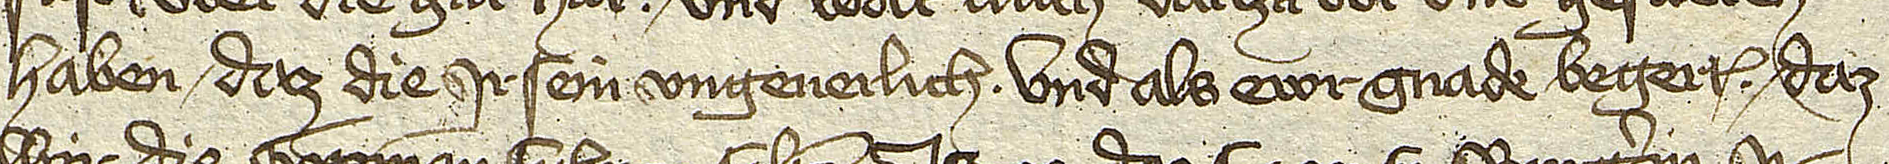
haben / daʒ die Ir ſein vngeuerlich . vnd als ewr gnade begert . / daʒ
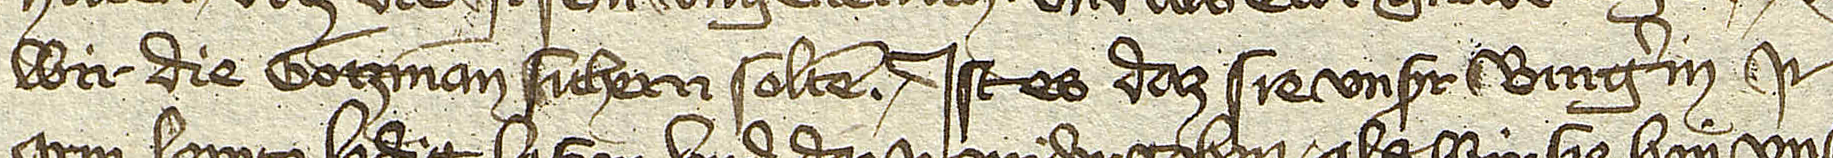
wir die Gocʒman ſichern ſolte* . / Iſt es daʒ ſie vnſ*r Burg*in Ir
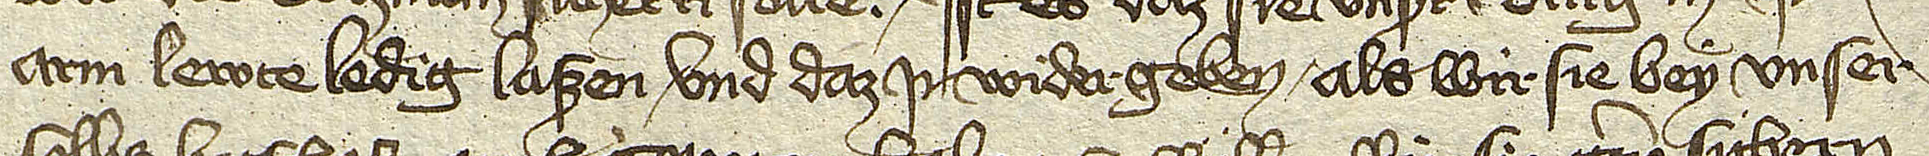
arm lewte ledig laſʒen / vnd daʒ Ir wider geben / als wir ſie bey vnſer
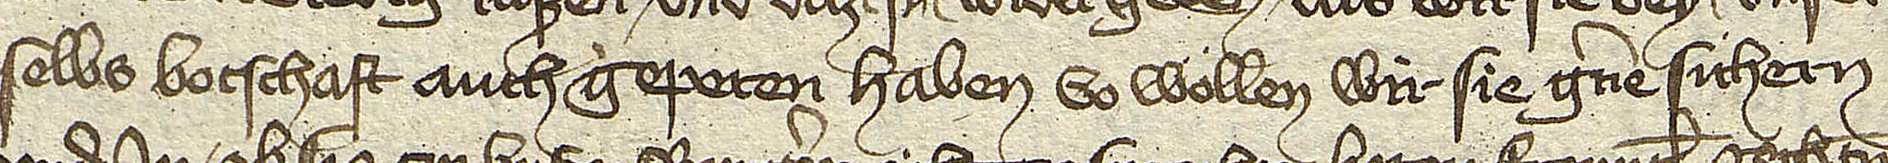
ſelbs botſchaft auch gepeten haben So wöllen wir ſie g*ne ſichern
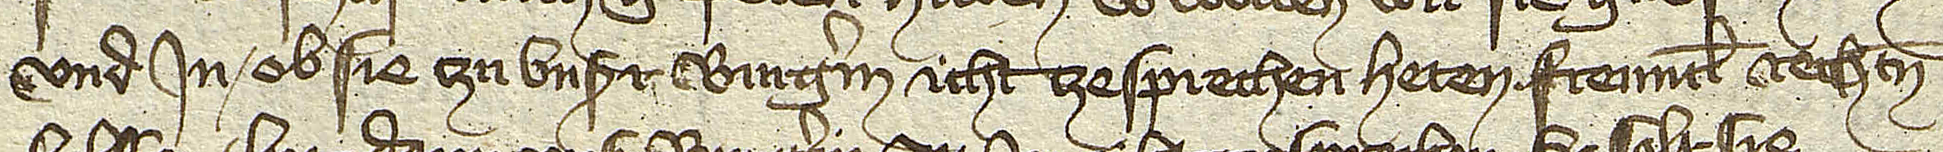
vnd In / ob ſie cʒu vnſ*r Burg*in icht cʒeſprechen heten freuntl* rechtn*
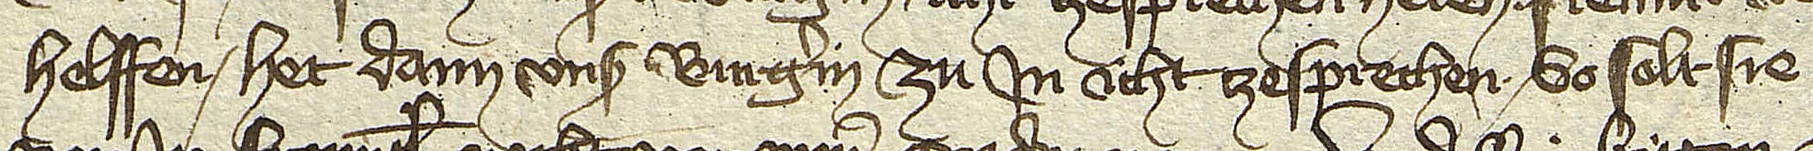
helffen / het dann vnſ* Burg*in cʒu In icht cʒeſprechen . / So ſolt ſie
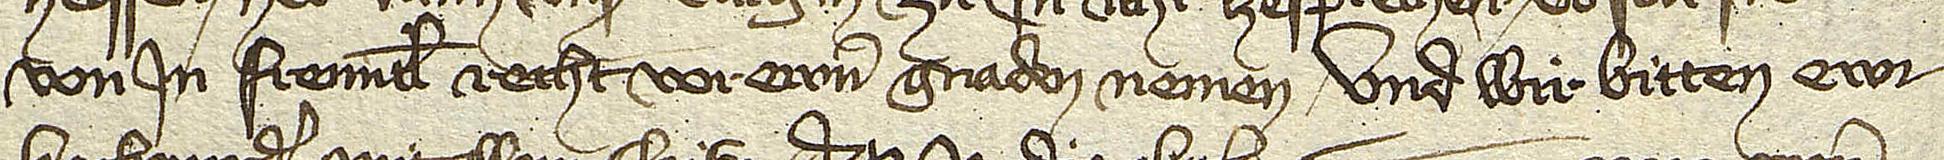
von In freuntl* recht von ewn* gnaden nemen / Vnd wir bitten ewr
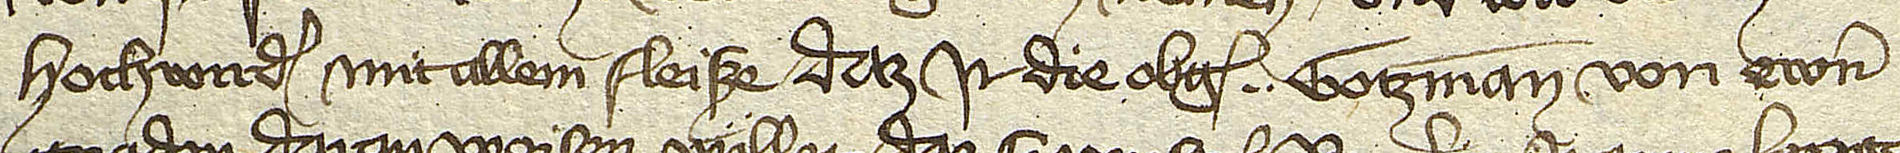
hochwird* mit allem fleiſʒe / daʒ Ir die obg* ~ Gocʒman* von ewn*
